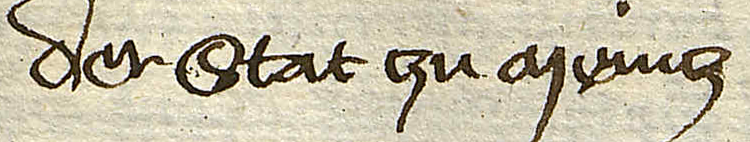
Der Stat cʒu Meincʒ
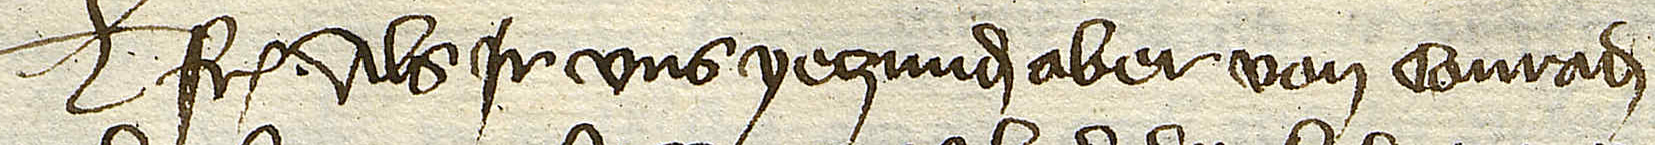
L* fr* . Als Ir vns yecʒund* aber von Conrad*
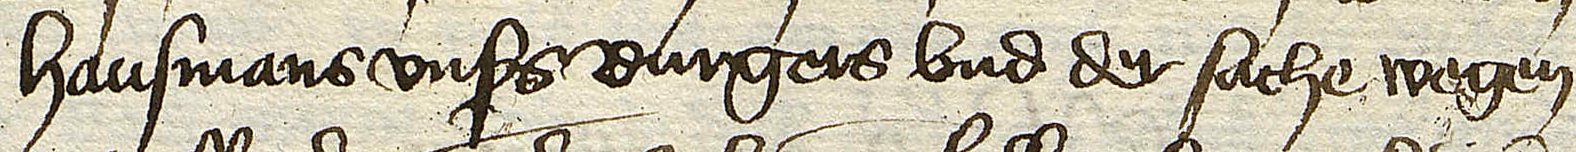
hauſmans vnſ*s burgers vnd der ſache wegen
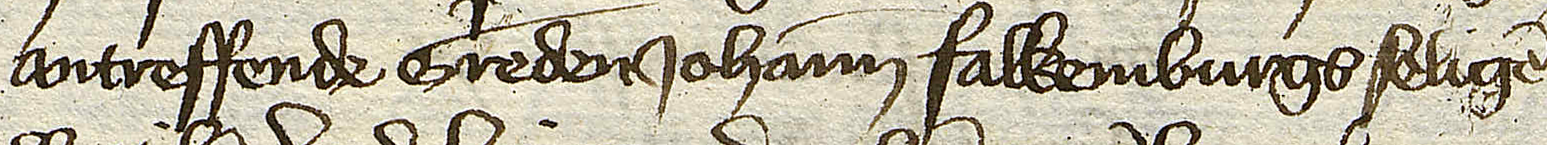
antreffende Greden Iohann* falkemburgs ſelige*
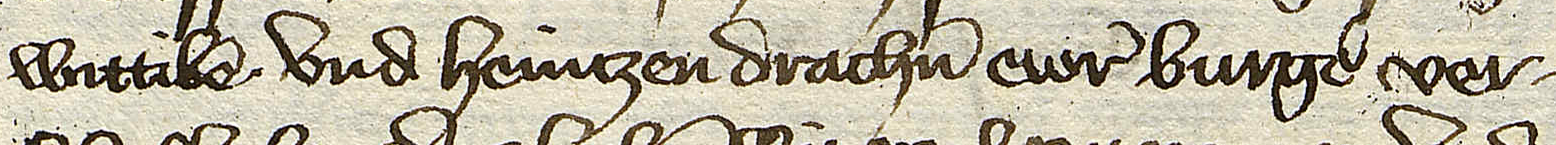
wittibe* vnd heincʒen drach*n ewr* burge* ver =
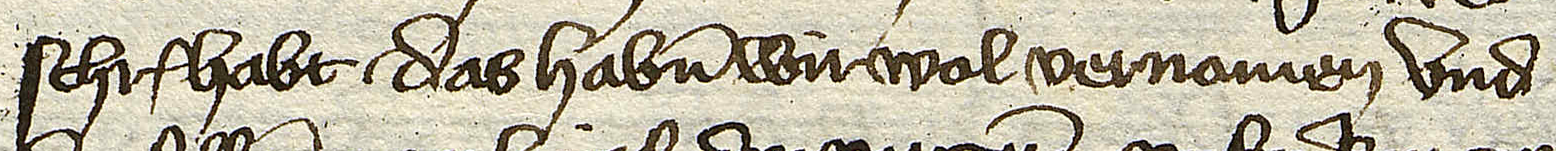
ſchr* habt / das hab*n wir wol vernomen Vnd
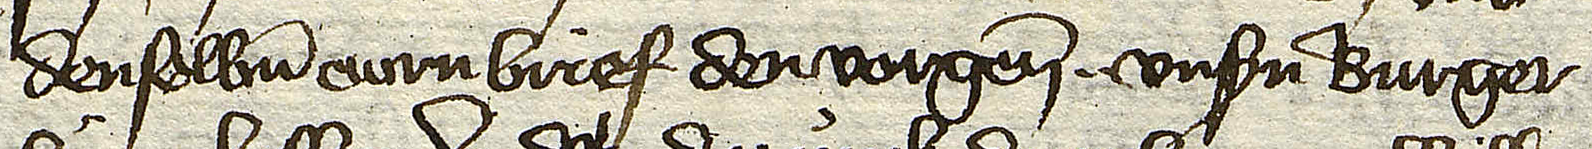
denſelb*n ewrn brief den vorgen* . vnſ*n Burger
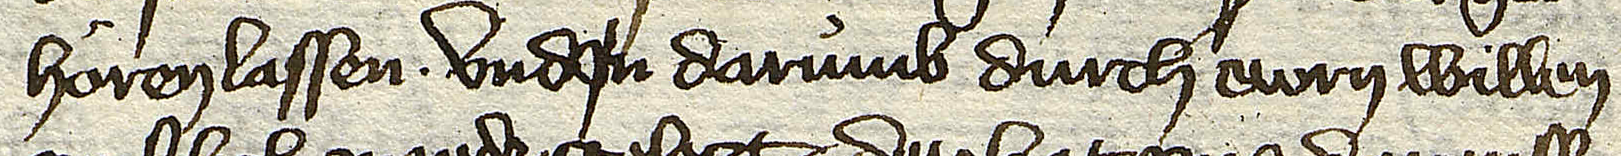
hören laſſen . Vnd In darümb durch ewrn willen
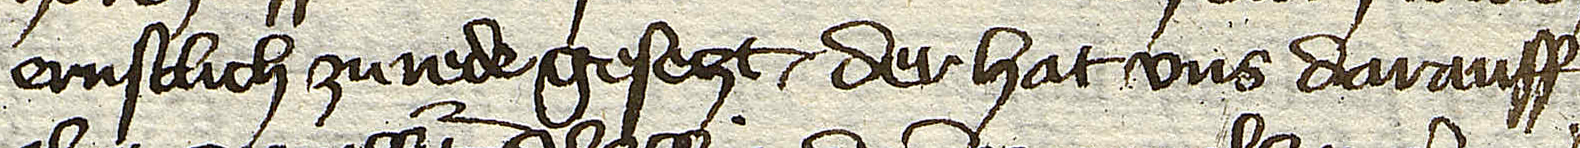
ernſtlich ʒu rede geſecʒt / der hat vns darauff
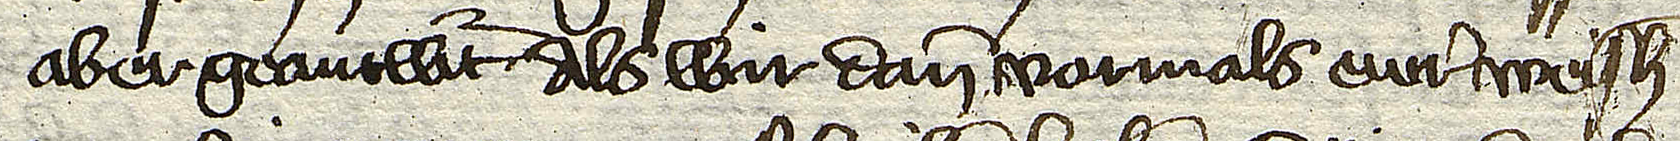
aber geantw*t / Als wir dan* vormals ewr* weiſh*
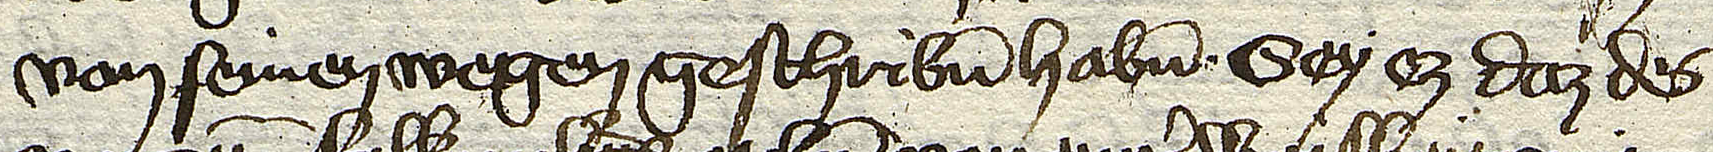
von ſeinen wegen geſchri*n hab*n . Sey eʒ daʒ des
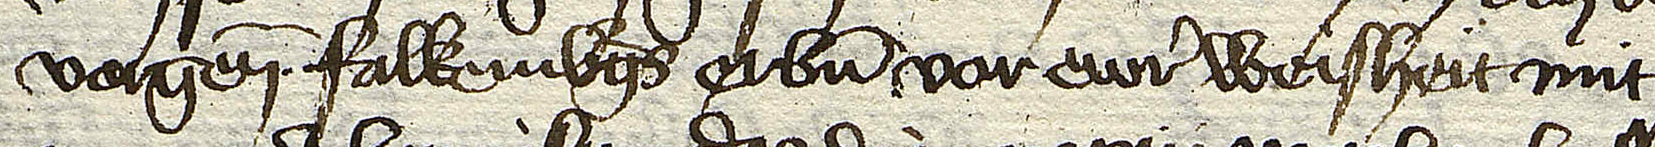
vorgen* . falkemb*gs erb*n vor ewr* weiſheit mit
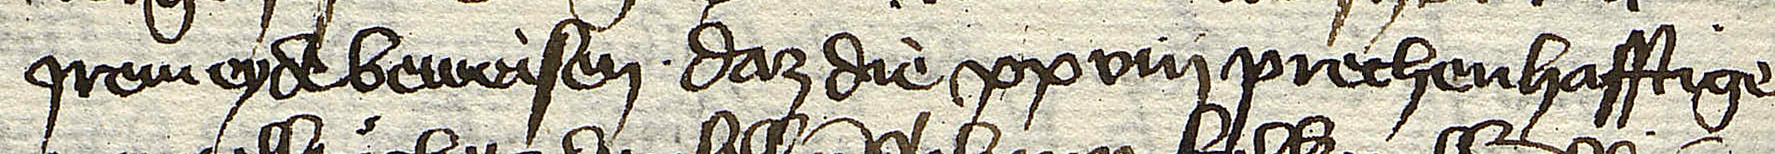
Irem eyde beweiſen . daʒ die xx viii prechenhafftige
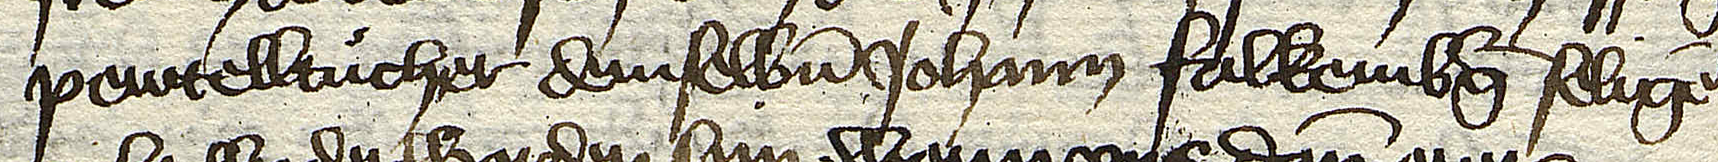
pewtelltücher demſelb* Iohann falkemb*g ſelige*
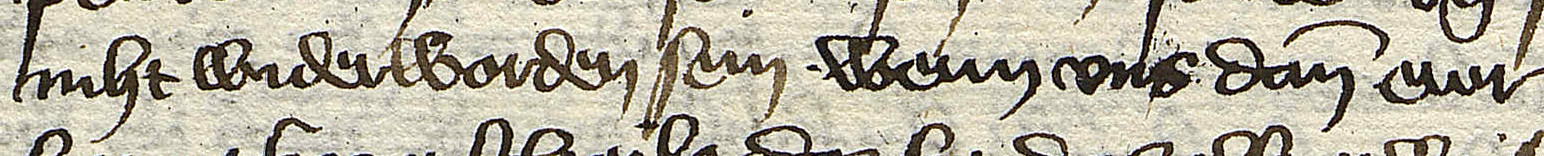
niht wideworden ſein . wenn vns dan* ewr
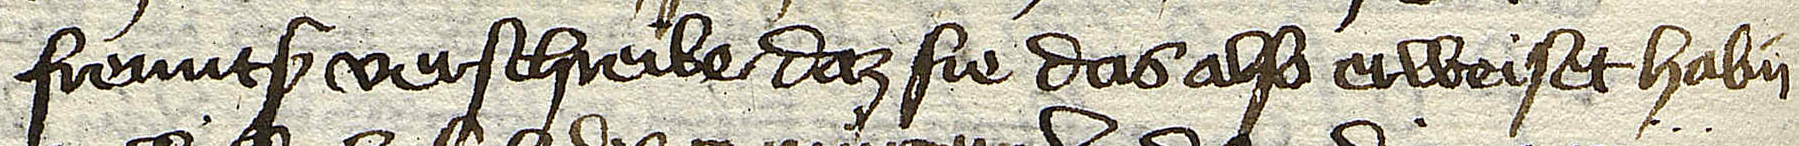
frewntſ* verſchribe* daʒ ſie das alſo erweiſet hab*n
